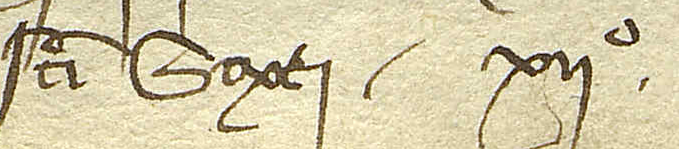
ſci* Sixt* / xii* .
